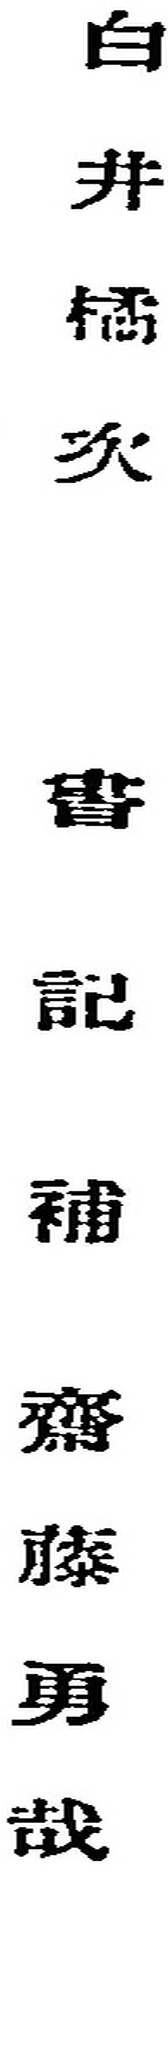仝白井橘次書記補齋藤勇哉
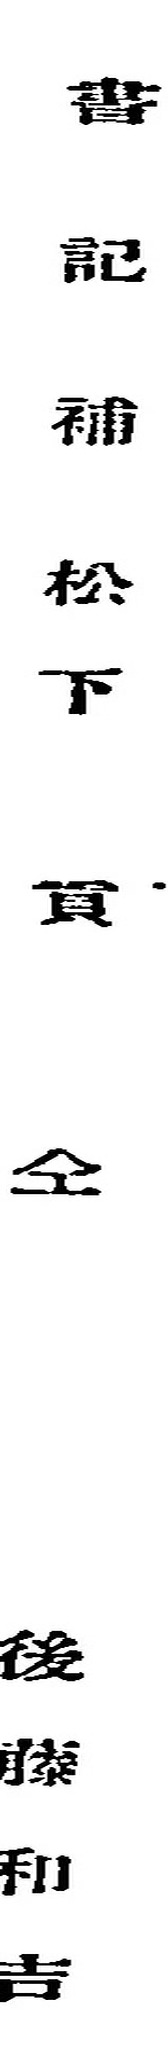書記補松下貢仝後藤和吉
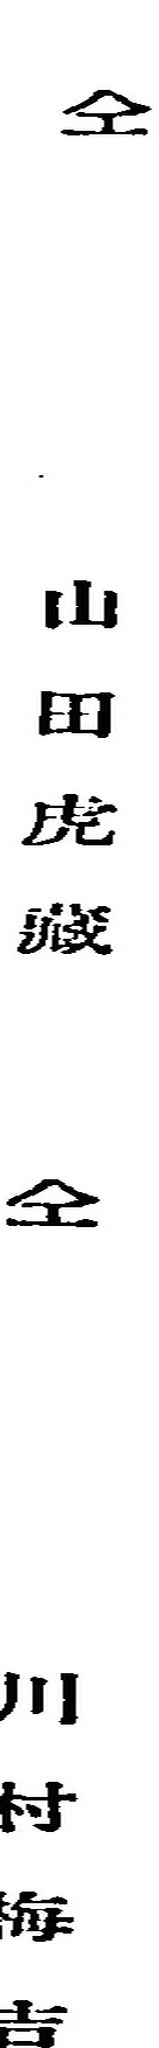仝山田虎藏仝川村梅吉
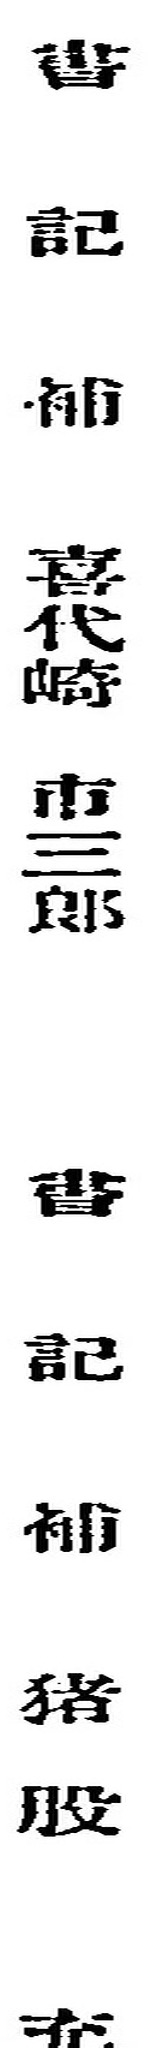書記補喜代崎市三郞書記補猪股充
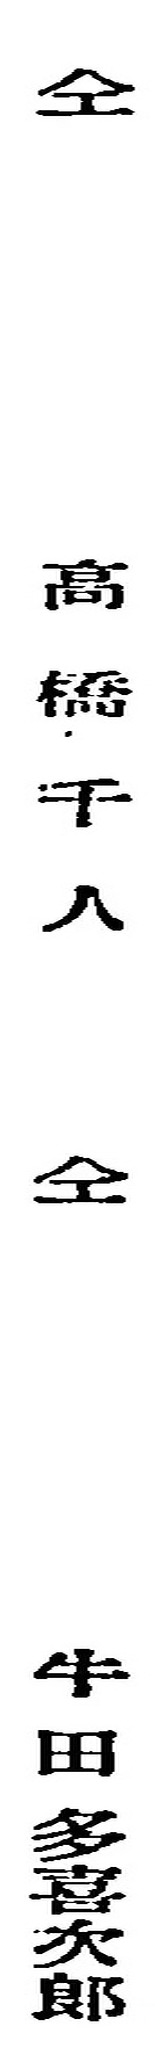仝高橋千人仝牛田多喜次郞
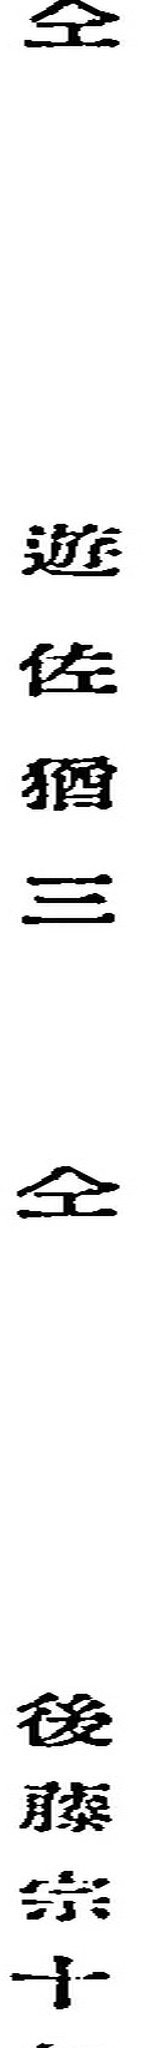仝遊佐猶三仝後藤宗十郞
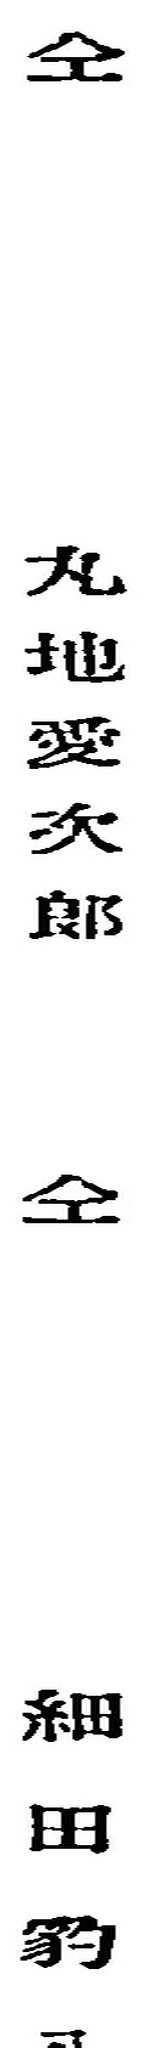仝丸地愛次郞仝細田豹八
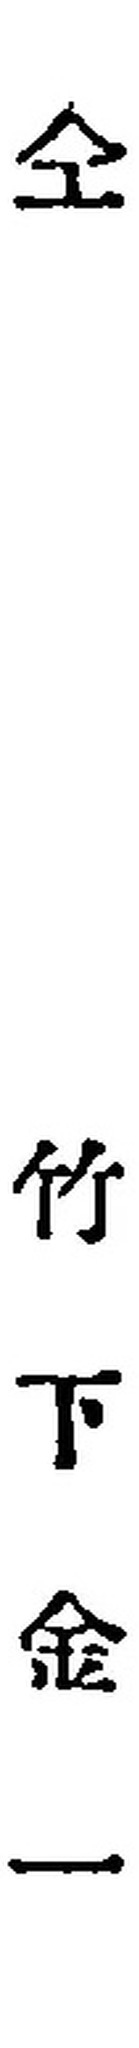仝竹下金一
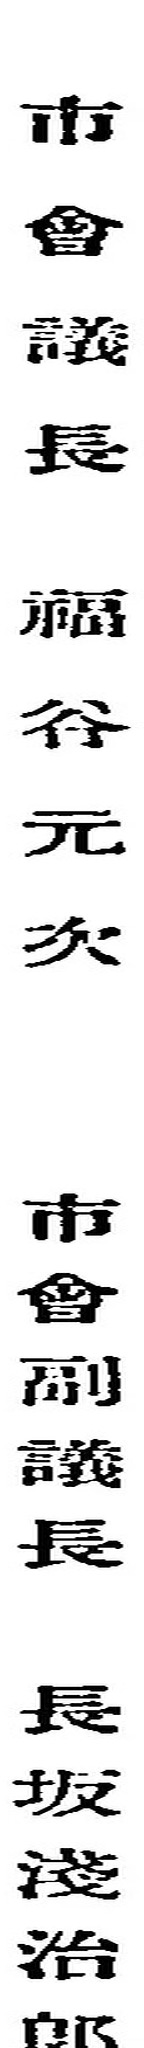市會議長福谷元次市會副議長長坂淺治郞
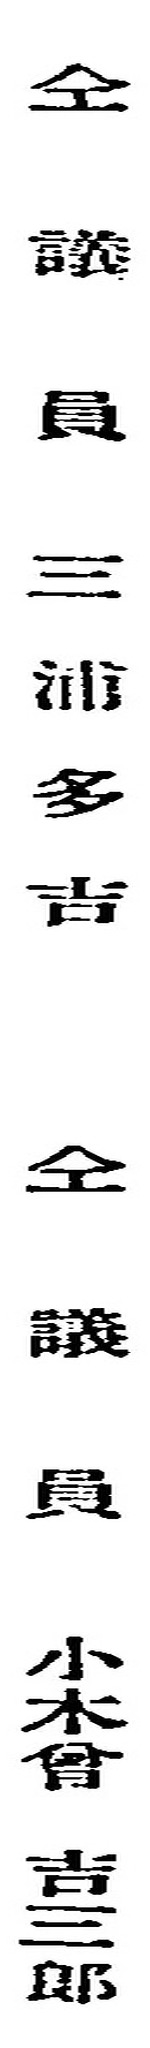仝議員三浦多吉仝議員小木曾吉三郞
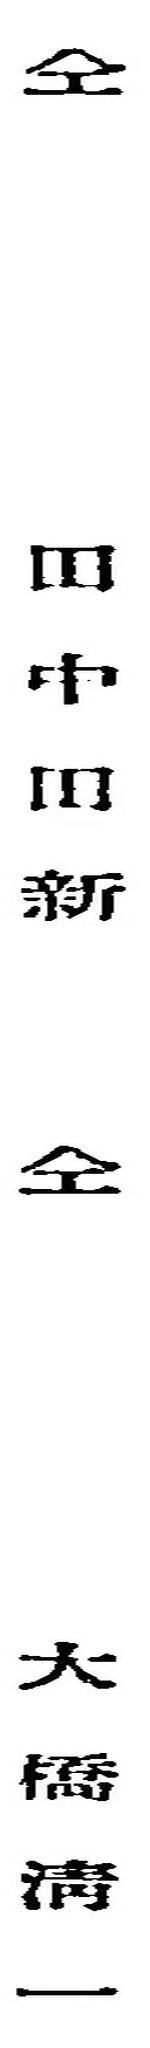仝田中田新仝大橋淸一
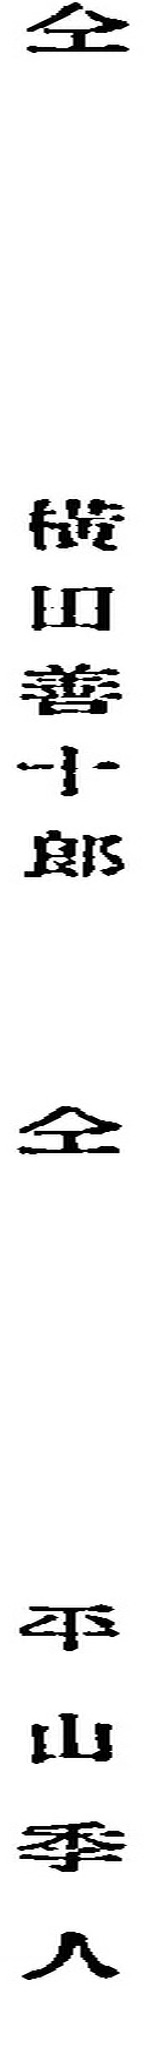仝横田善十郞仝平山季人
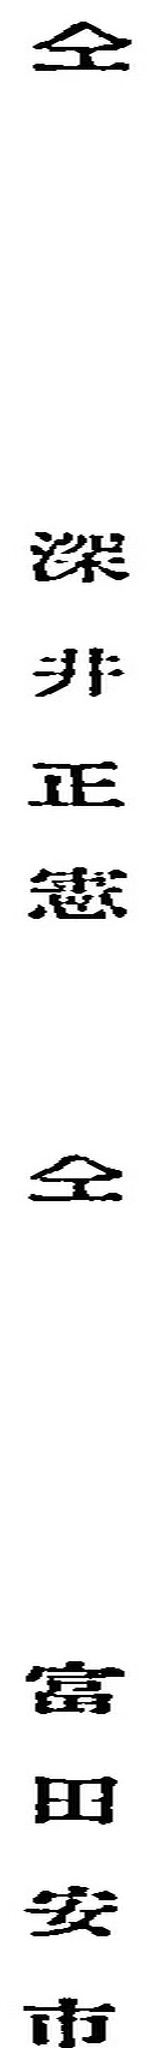仝深井正憲仝富田安市
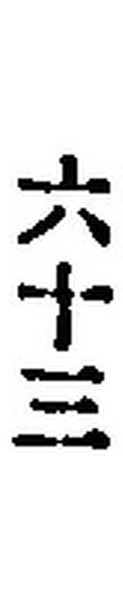六十三

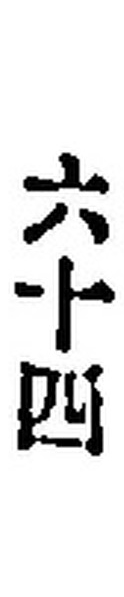六十四
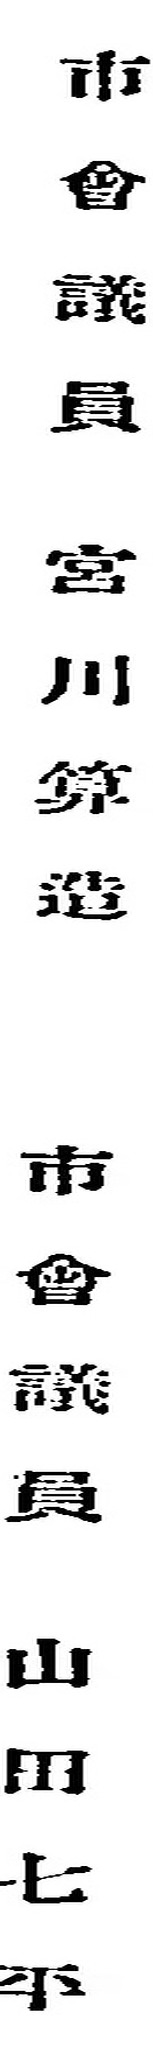市會議員宮川算造市會議員山田七平
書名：豊橋志要
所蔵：国立国会図書館 National Diet Library, JAPAN
